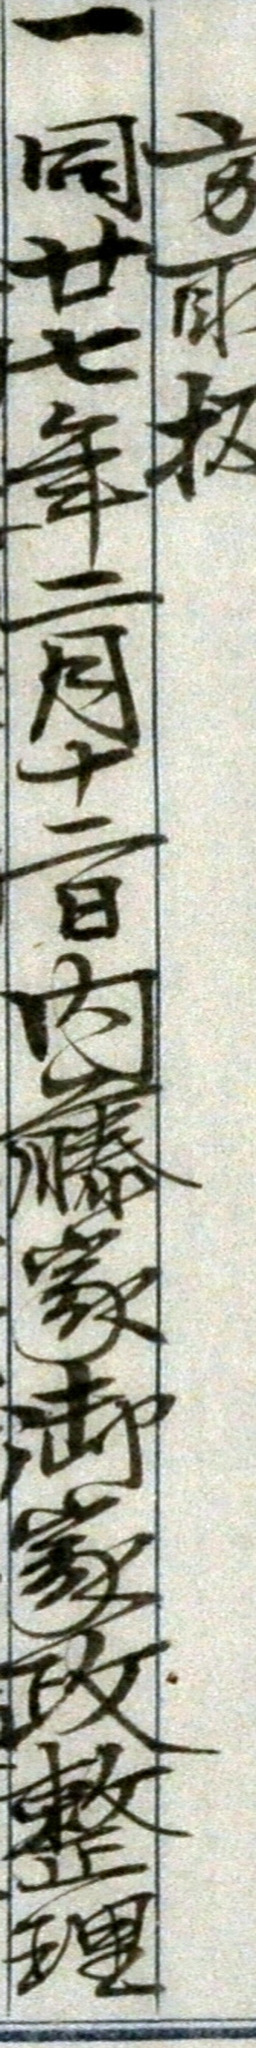一同廿七年二月十二日内藤家御家政整理
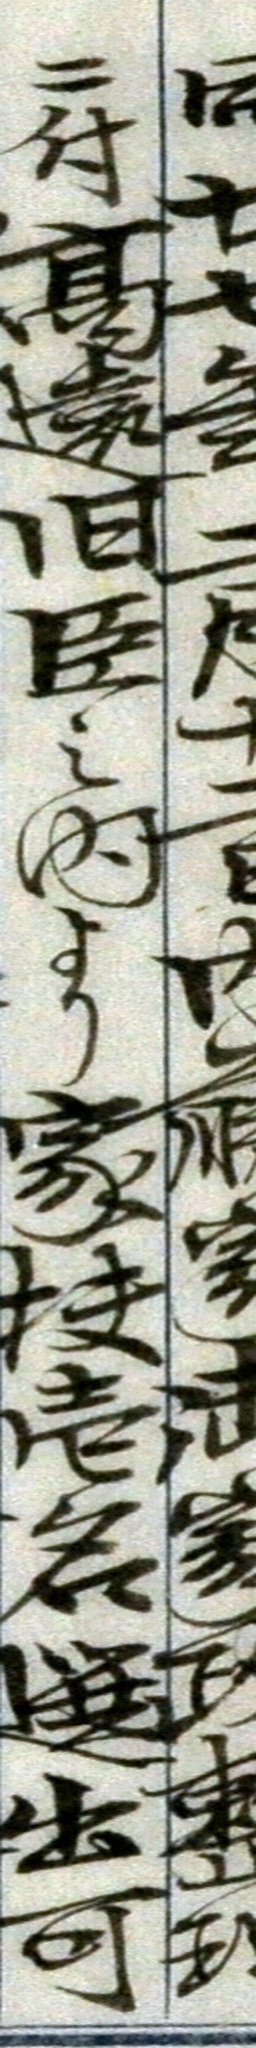ニ付高遠旧臣之内より家扶壱名選出可
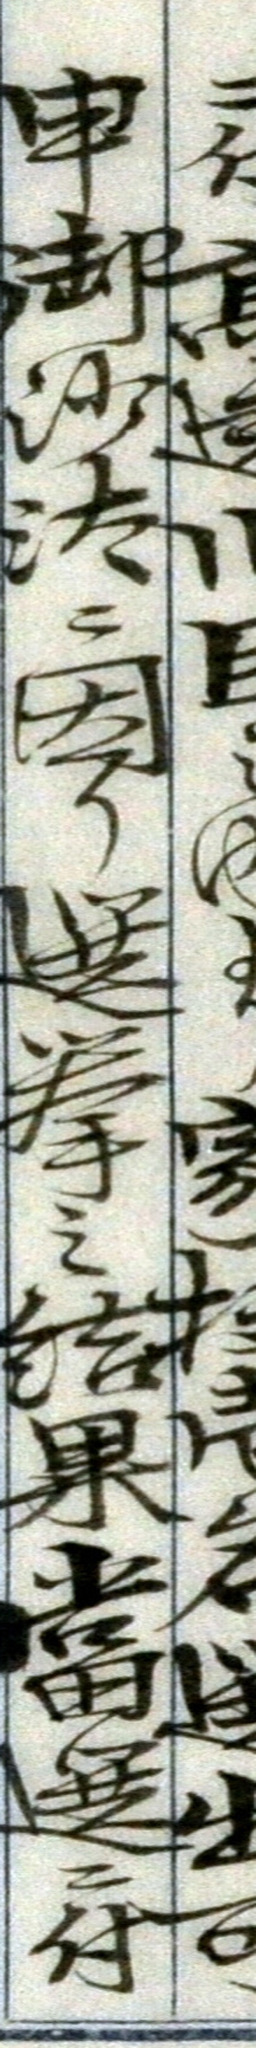申御沙汰ニ因り選挙之結果当選ニ付
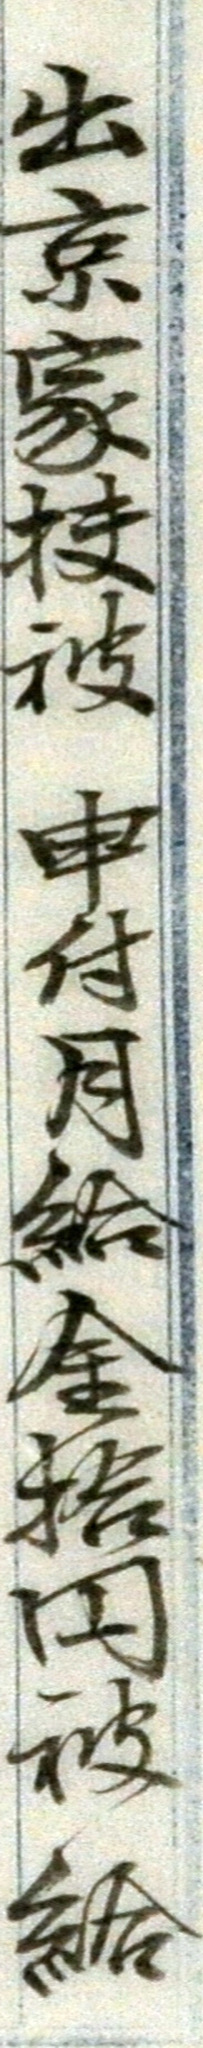出京家扶被申付月給金拾円被給
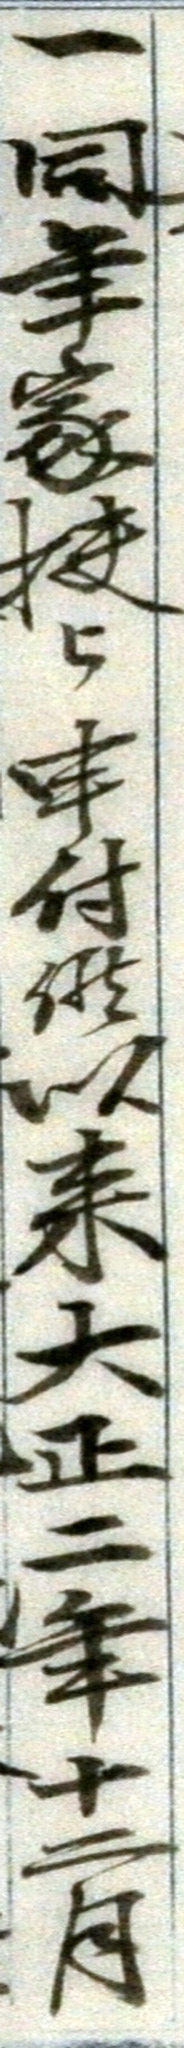一同年家扶被申付候以来大正二年十二月
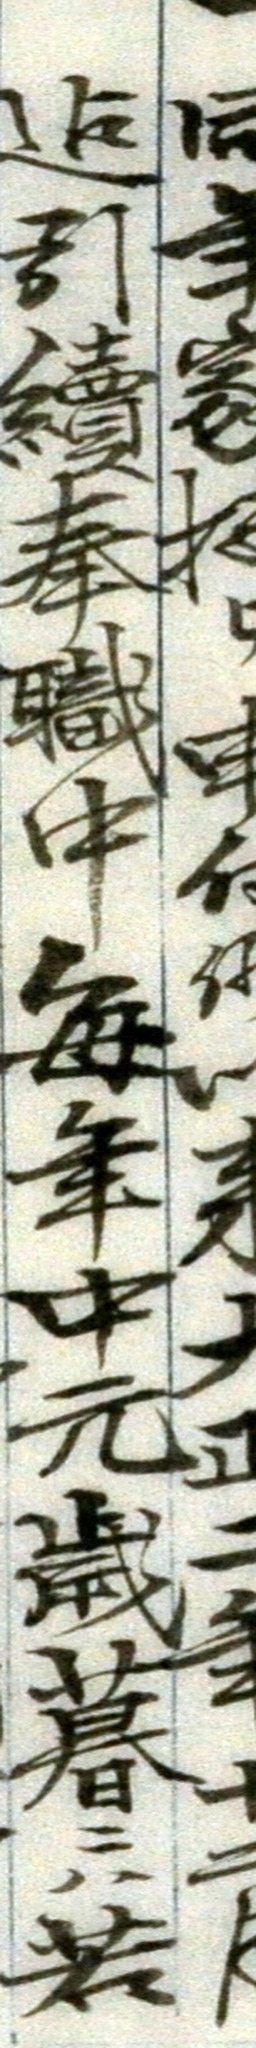迄引続奉職中毎年中元歳暮ニハ若
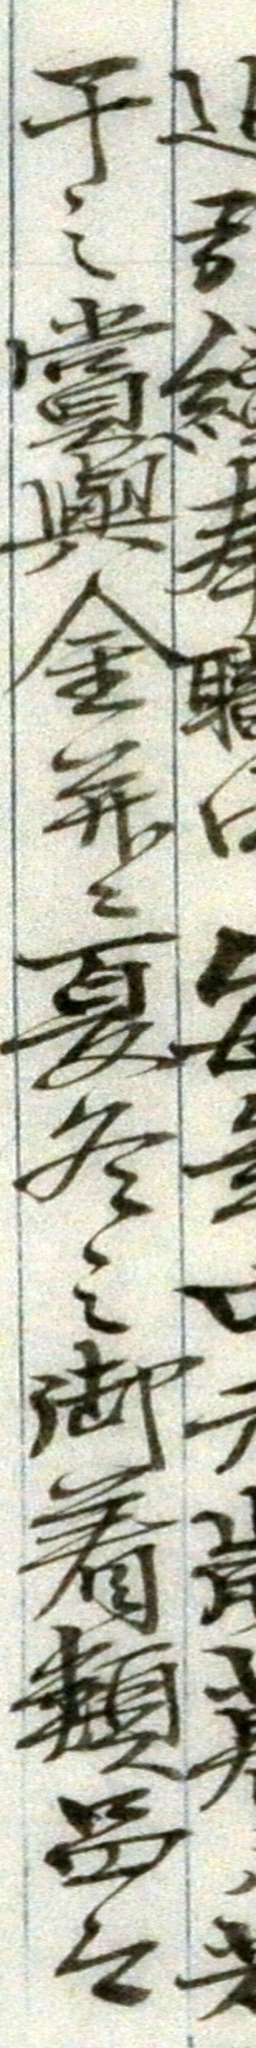干之賞与金并ニ夏冬之御着類品々
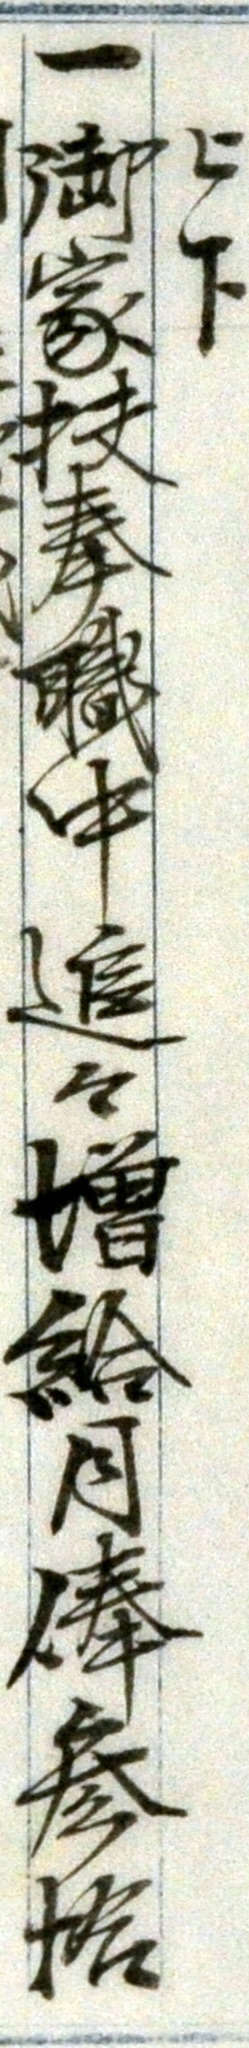一御家扶奉職中追々増給月俸参拾
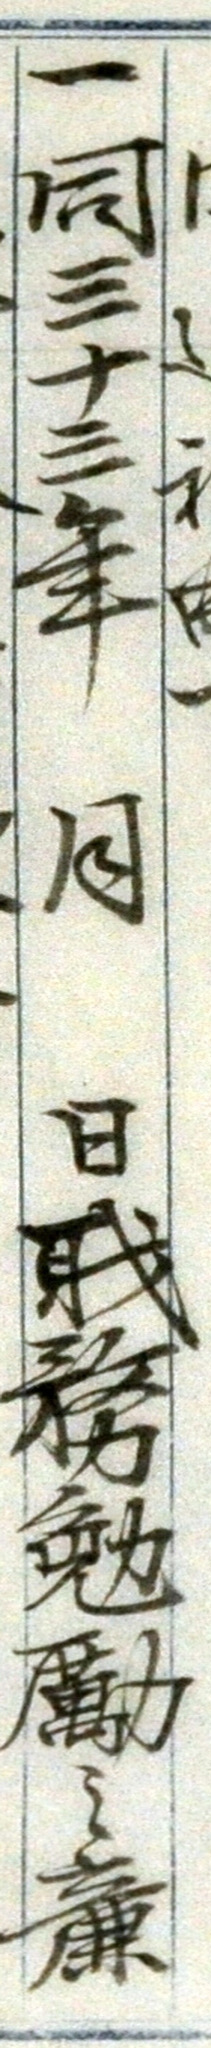一同三十三年月日職務勉励之廉
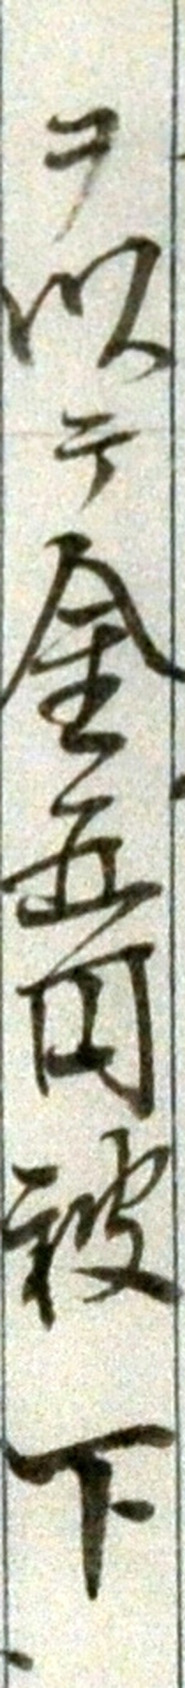ヲ以テ金五円被下
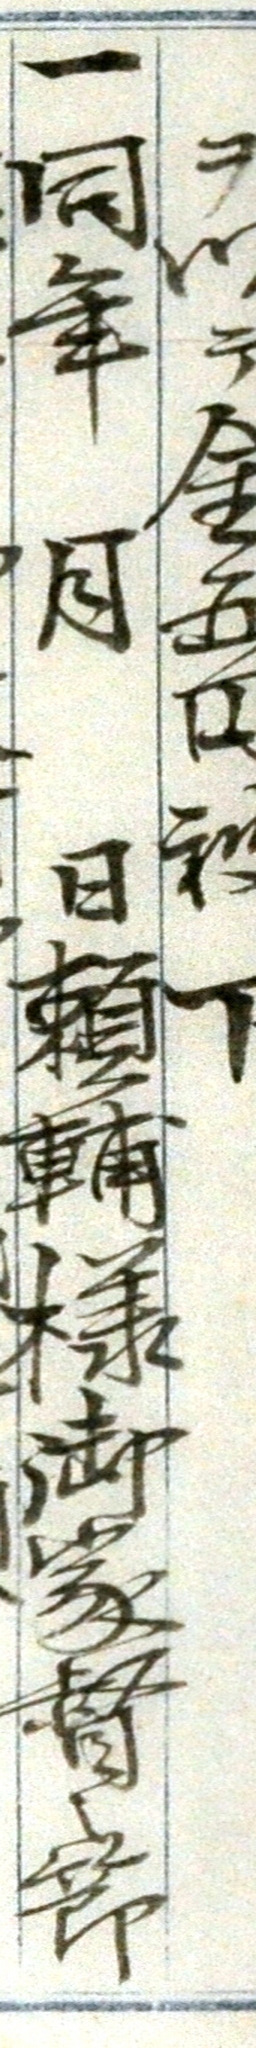一同年月日頼輔様御家督之節

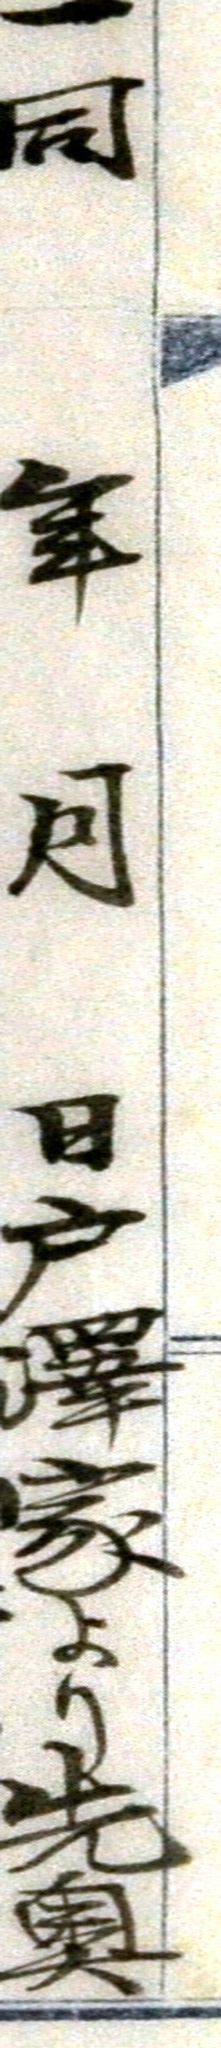一同年月日戸澤家より先奥
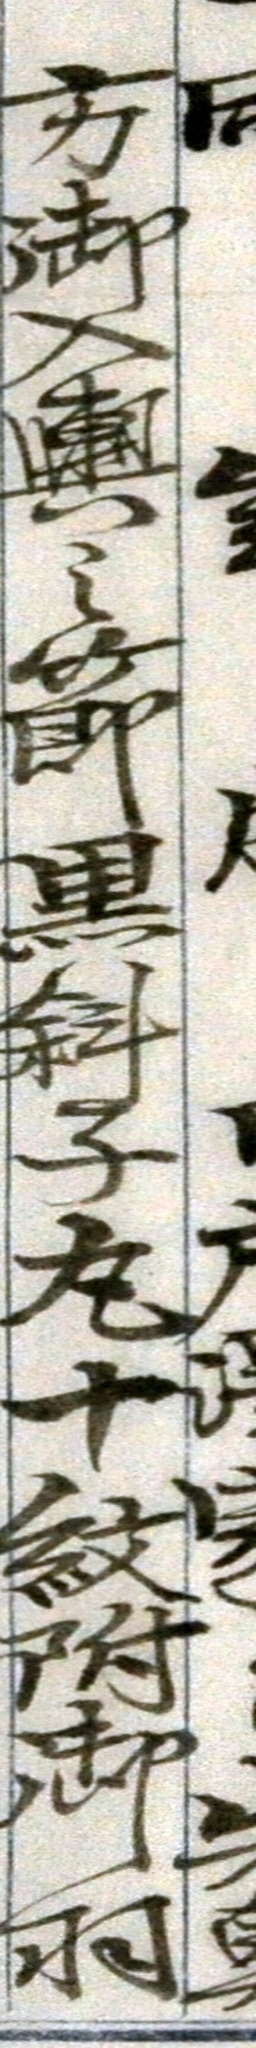方御入輿之節黒斜子丸十紋付御羽
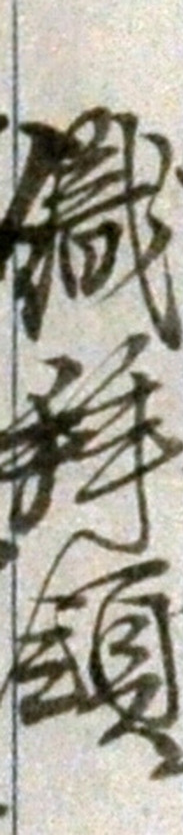織拝領
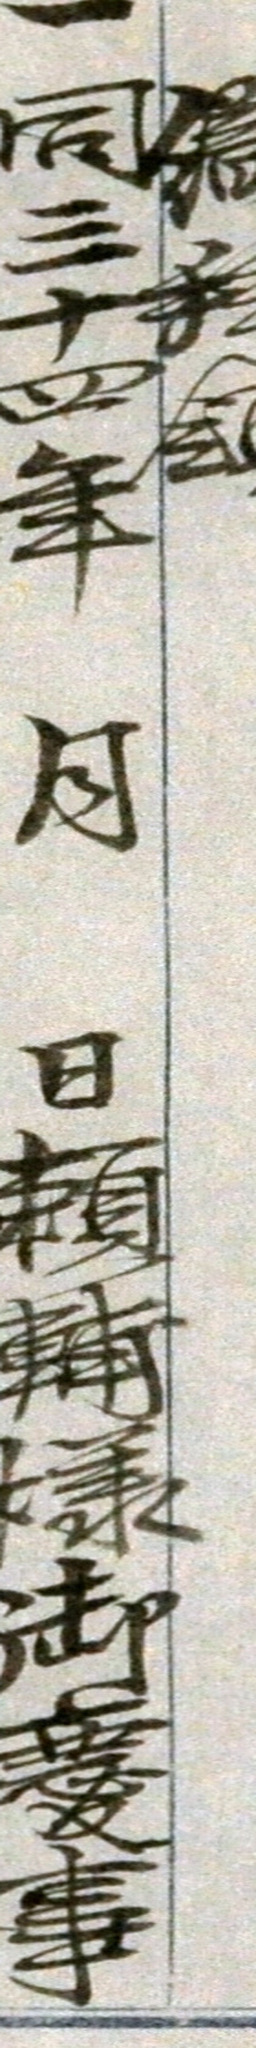一同三十四年月日頼輔様御慶事
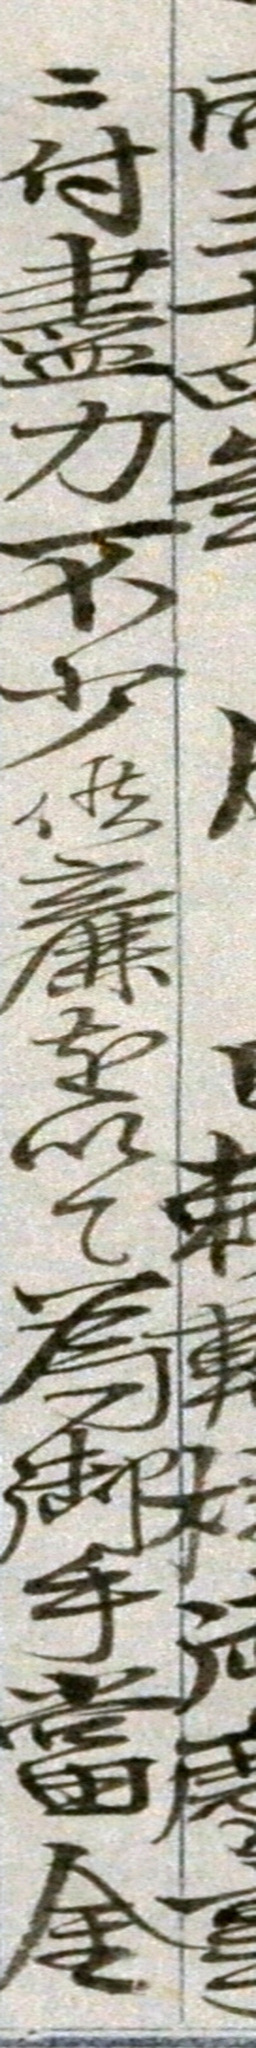ニ付尽力不少候廉を以て為御手当金
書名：三好氏先代以来勤仕録、池田丈介一家勤仕録
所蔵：伊那市立高遠町図書館・合同会社AMANE
